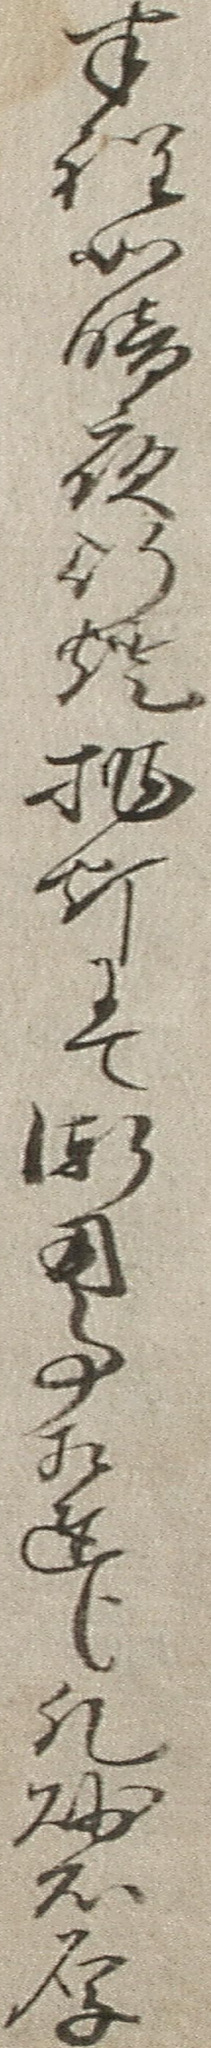半程如暗夜行燈挑灯にて漸用事相達申候凡砂石厚
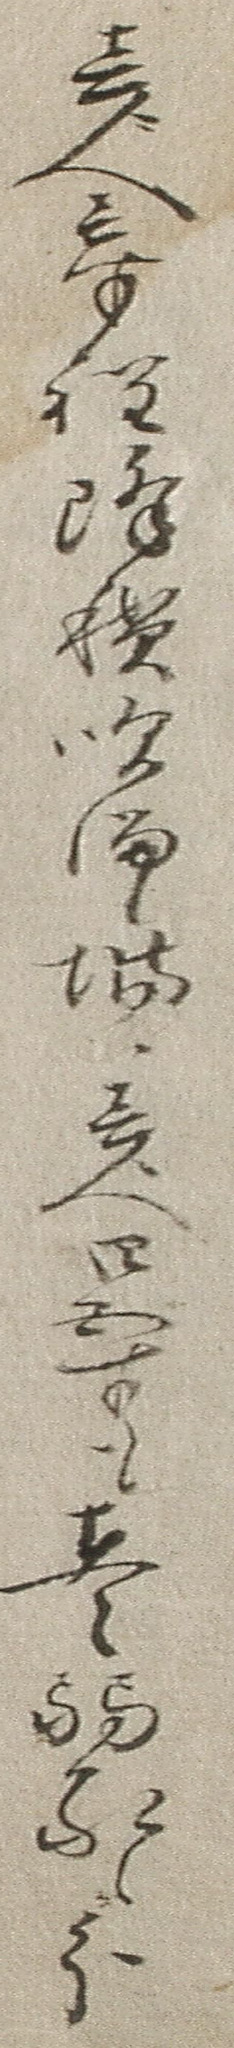壱尺壱寸程降積吹溜候場壱尺四五寸も在之弱家之分
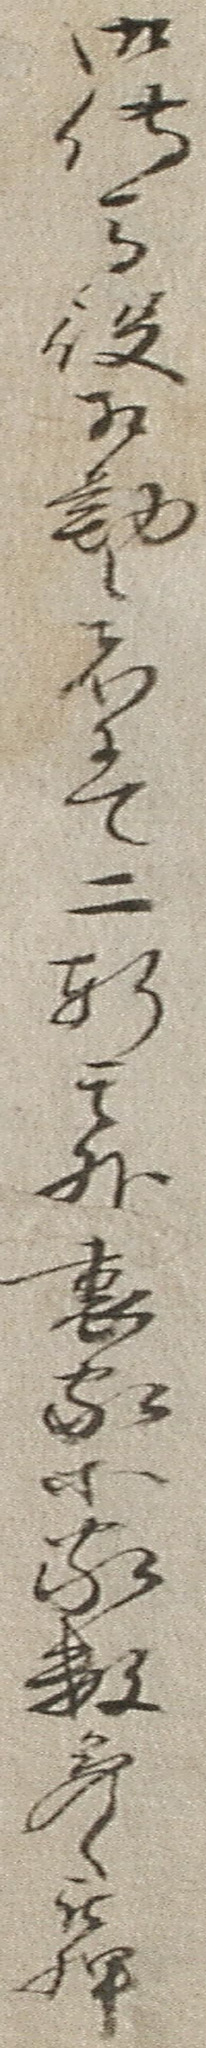御伝馬役相勤候者にて二軒其外裏家等家数多く被押
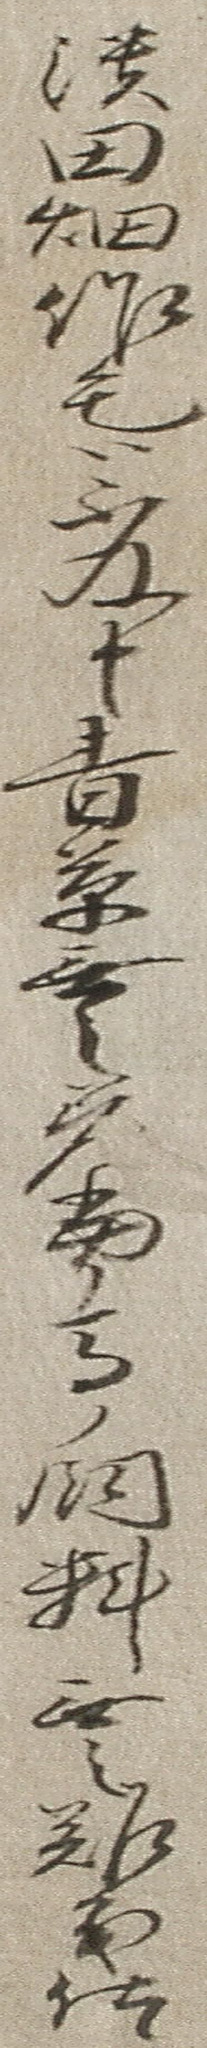潰田畑作毛は不及申青草無之差当り馬の飼料無之難義仕候
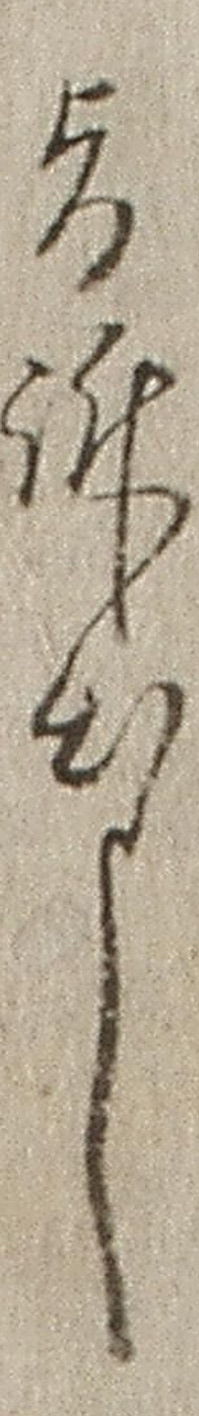旨訴出申候
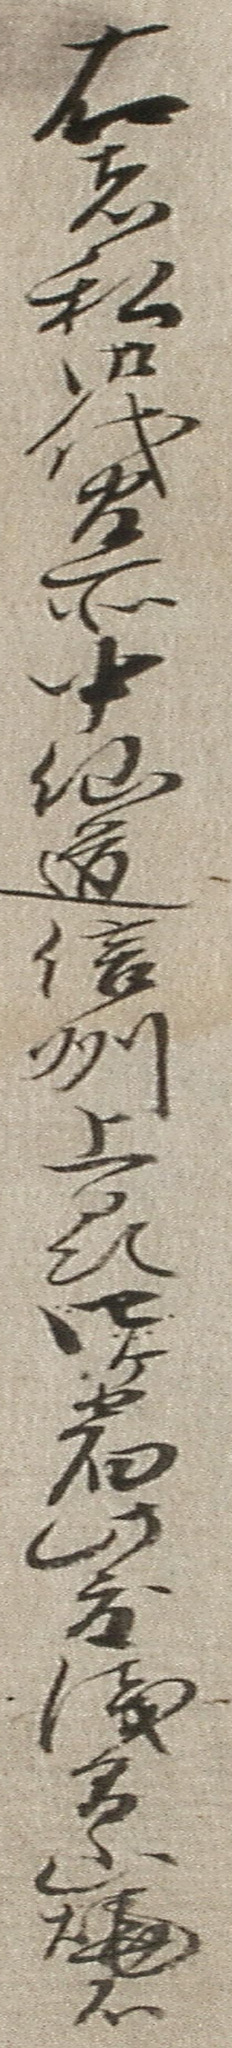右者私御代官所中仙道信州上州四ケ宿此度浅間山焼石
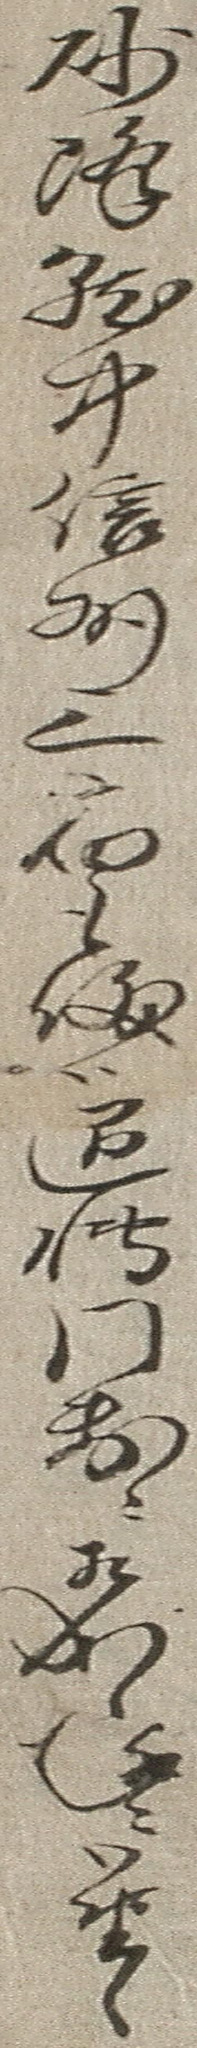砂降就中信州三宿之儀は退転同前に相成候趣に御座候
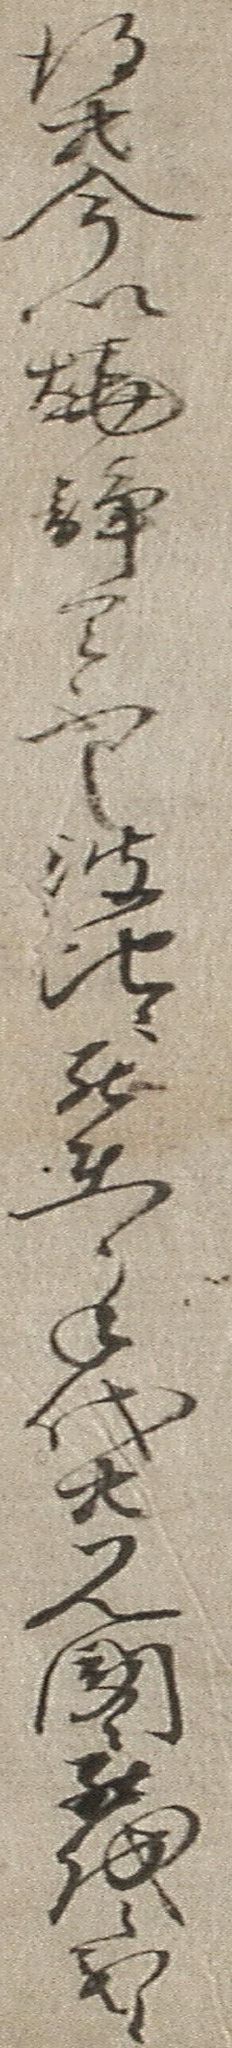得共今以焼静り不申彼地に罷在候手代共見聞罷越候義も
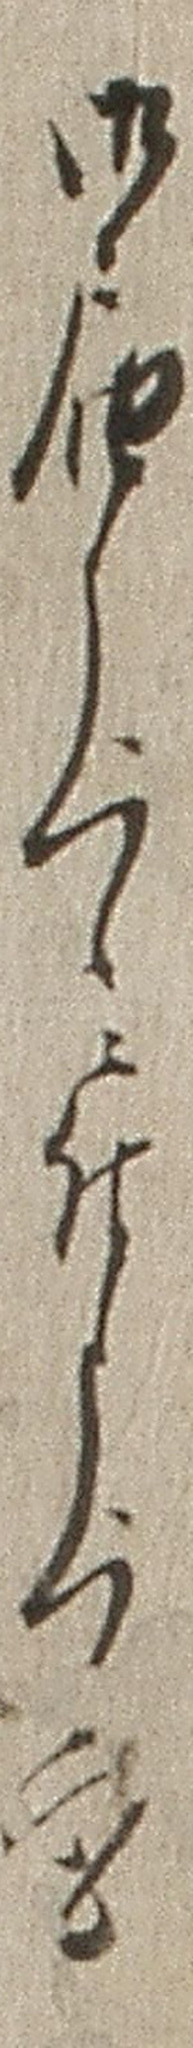御届申上候に付申上候以上
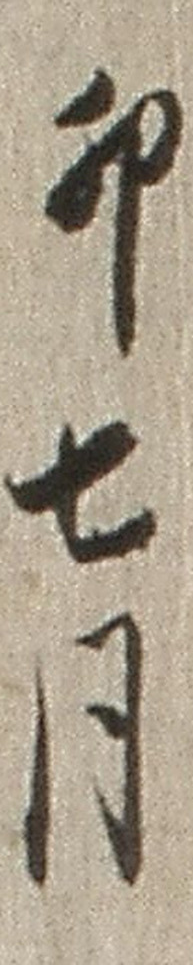卯七月
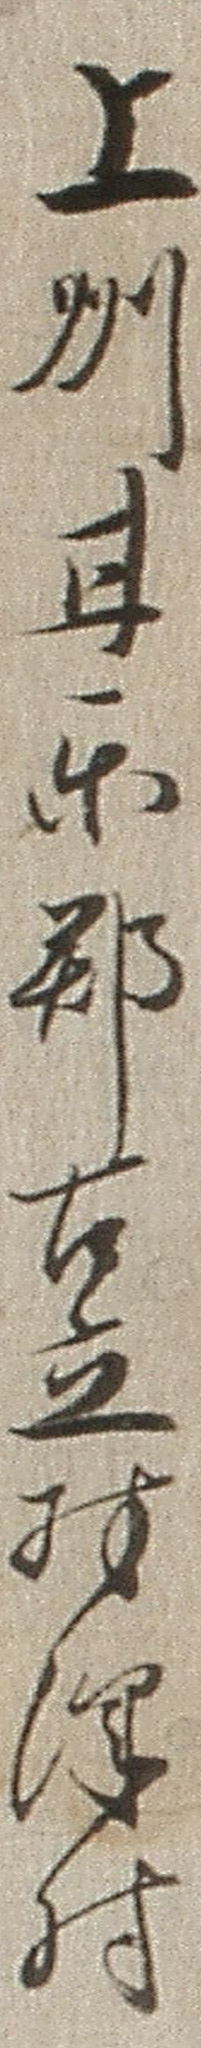上州甘楽郡古立村沢村
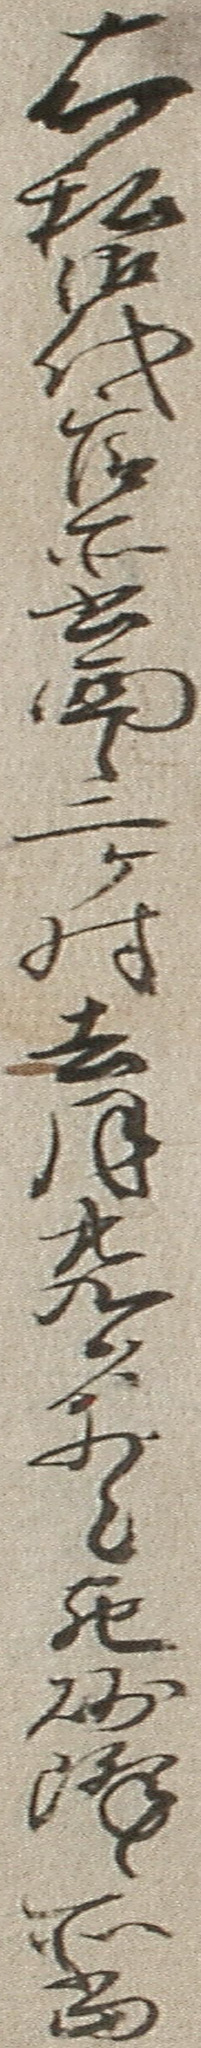右私御代官所書面之二ケ村去月廿九日ゟ少し宛砂降候所当
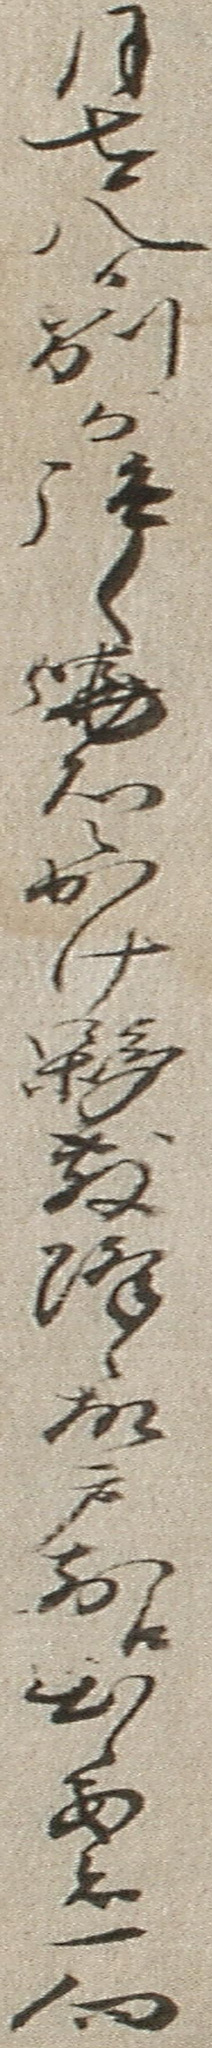月七日八日別而強く焼石之かけ夥敷降候故戸前江出候義者一向
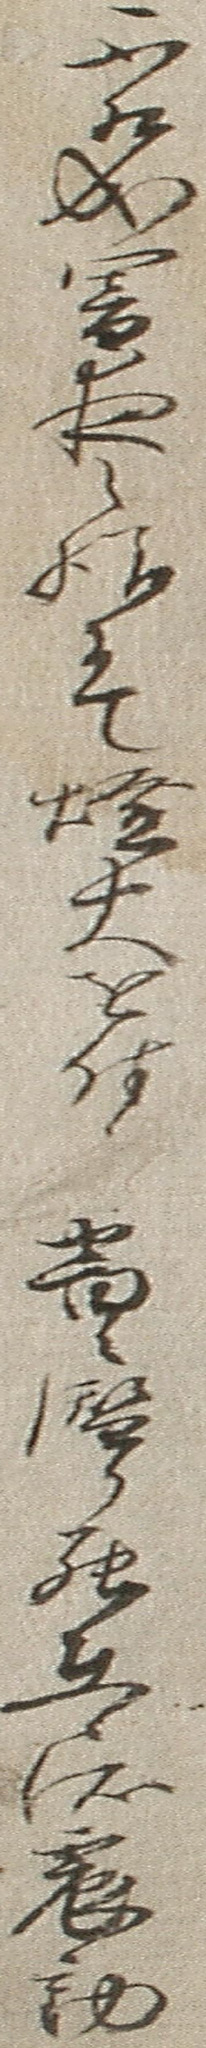不相成闇夜の様にて燈火を付候宿に潜り罷在候処震動
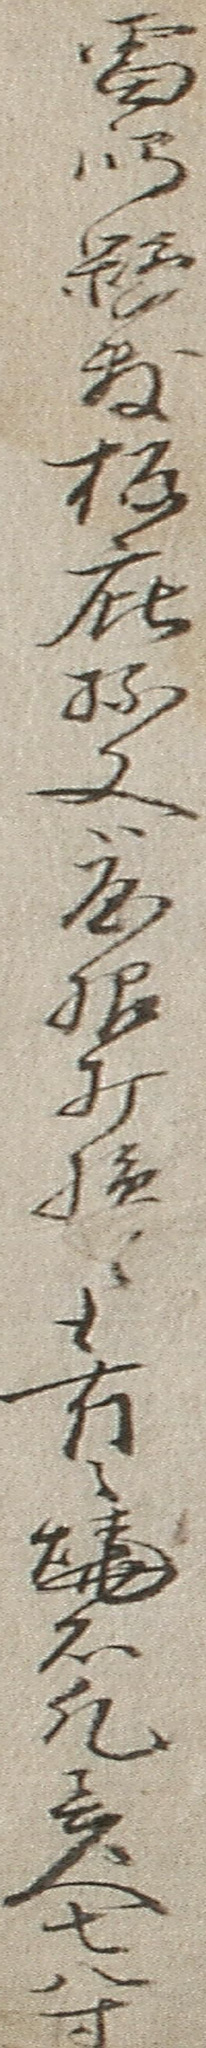雷鳴夥敷板庇抔又は屋根打損候も有之焼石凡壱尺七八寸
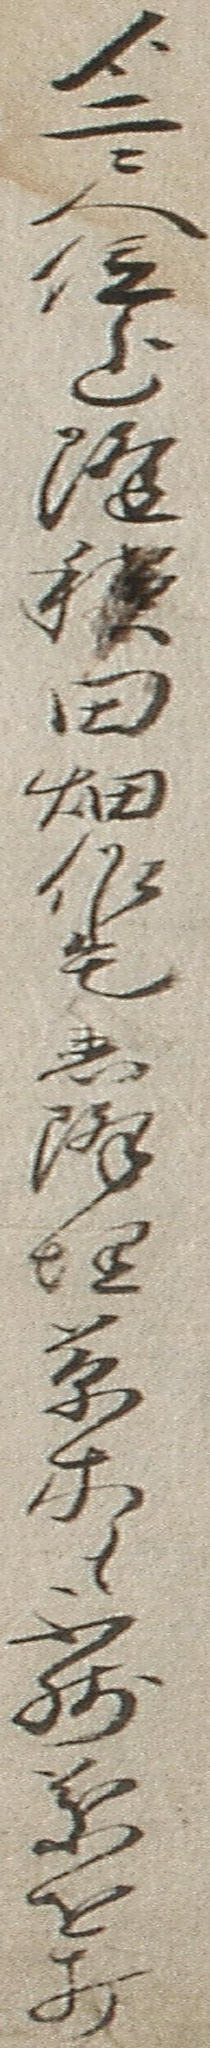ゟ二尺位降積田畑作毛は降埋草木も不残葉を打
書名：太平秘録抜書　浅間山燒及普賢山崩
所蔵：東京大学地震研究所図書室 Earthquake Research Institute Library, The University of Tokyo, JAPAN
